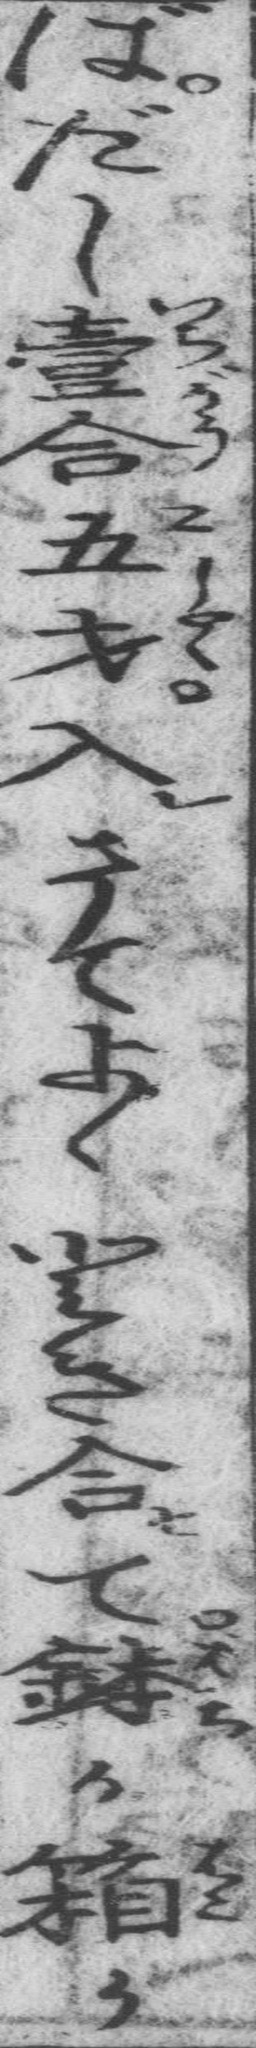ば。だし壱合五才。入れさてよくとき合せて。鉢か箱か
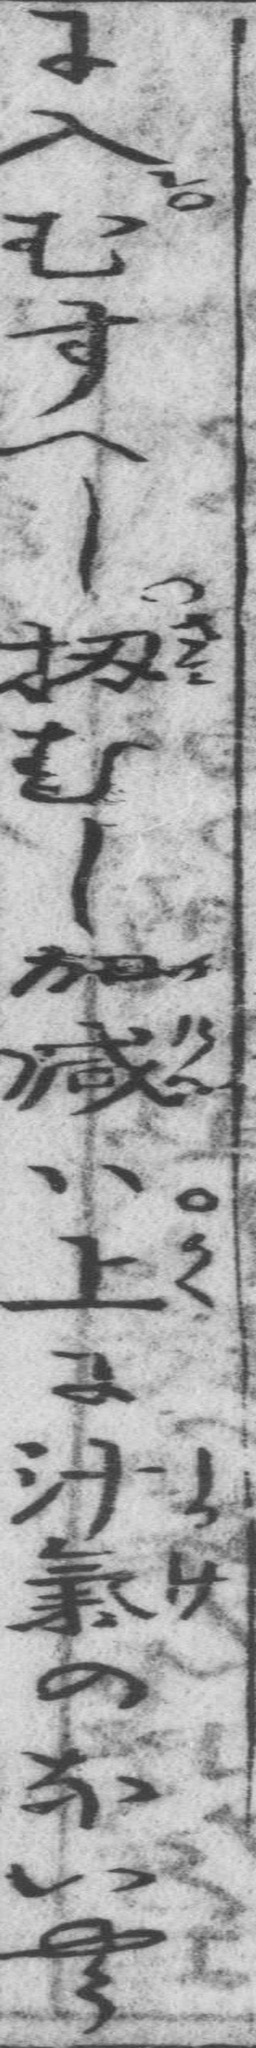に入れ。むすへし。扨むし加減は。上ひ汁気のないやう
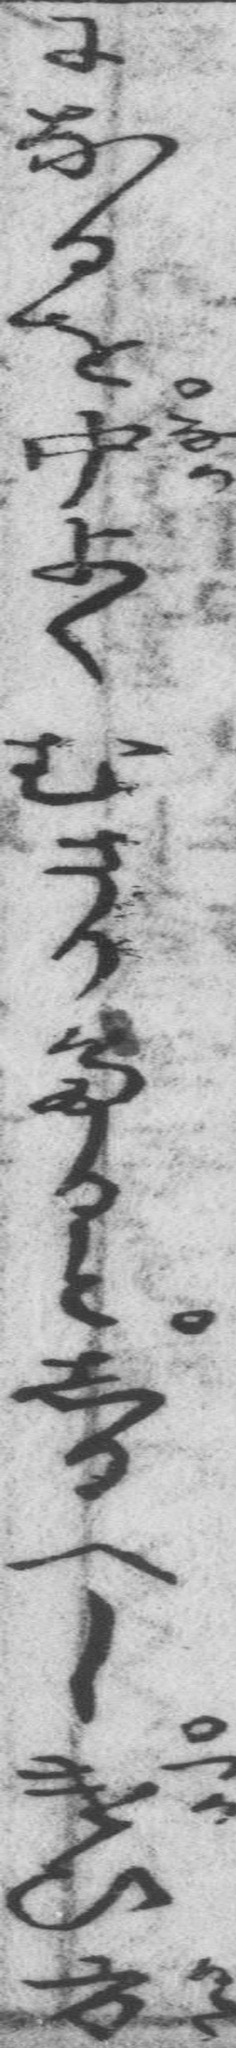になるを。中よくむさりたると。しるへし。遣ひ方
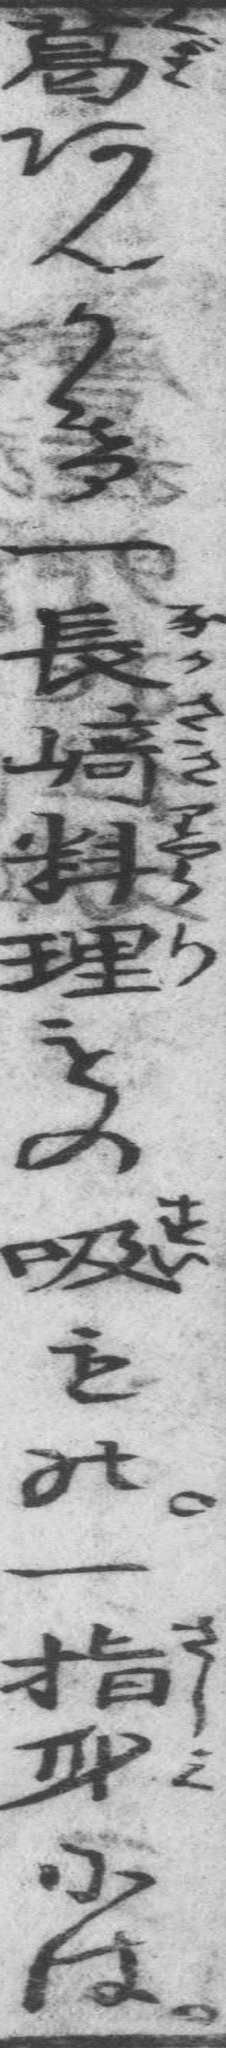葛あんかけ一長崎料理もの吸もの。一指身には。
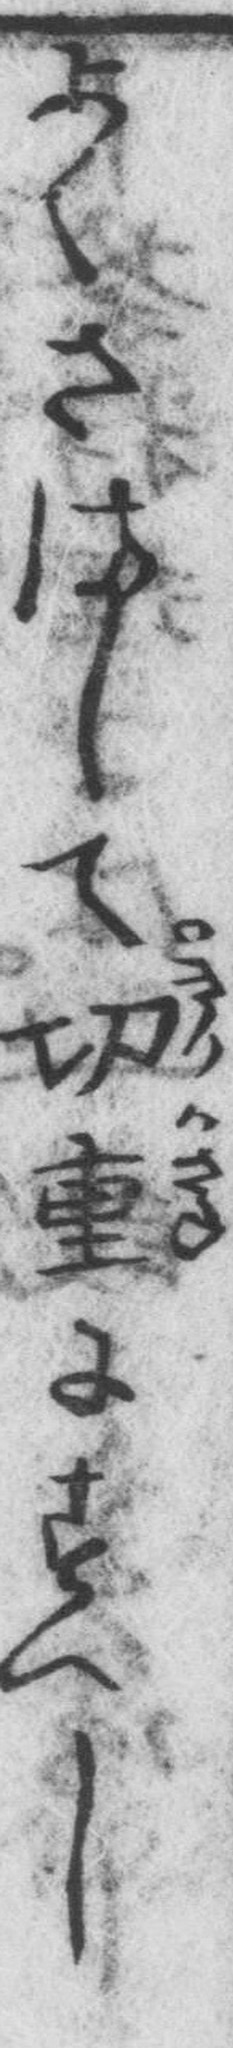よくさまして。切重にすへし
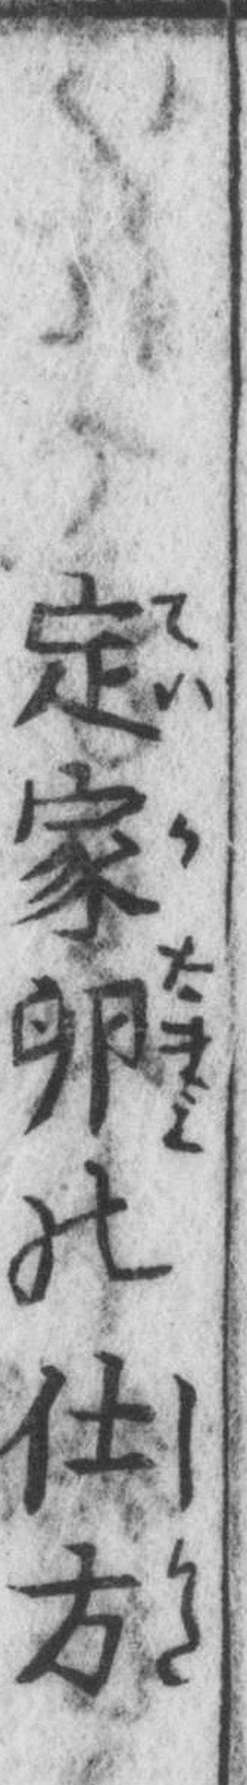定家卵の仕方
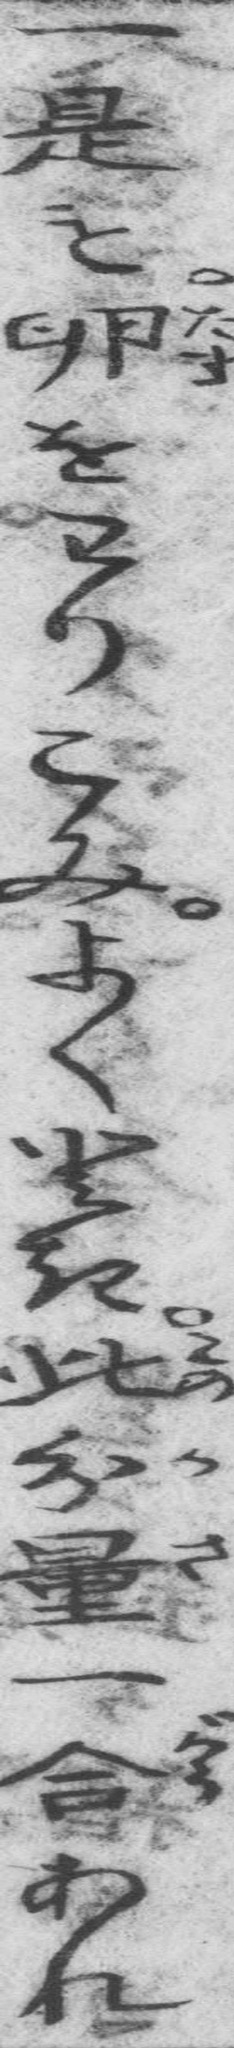一是も。卵をわりこみ。よくとき。此分量一合あれ
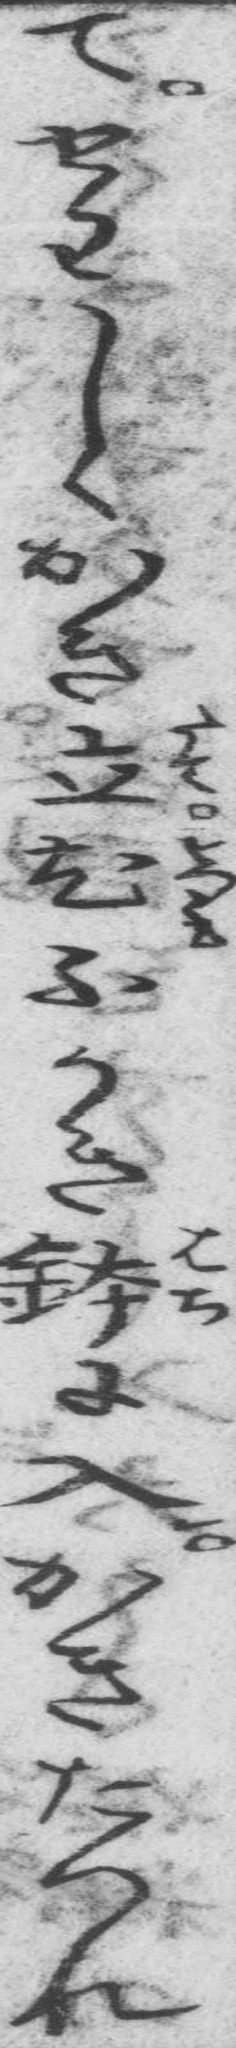て。せわしくかき立。尤ふかき鉢に入れ。かきたつれ
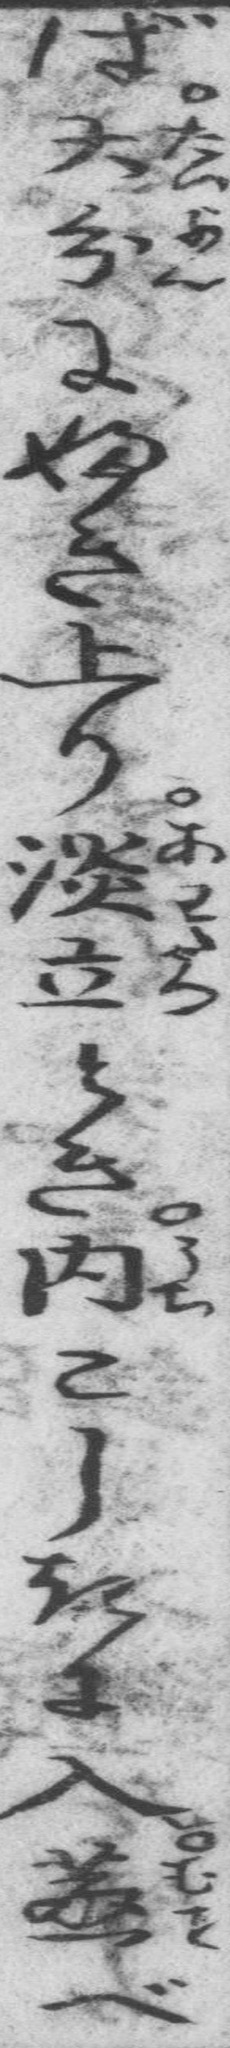ば。大分にふき上り。淡立とき。内こしきに入れ。蒸べ
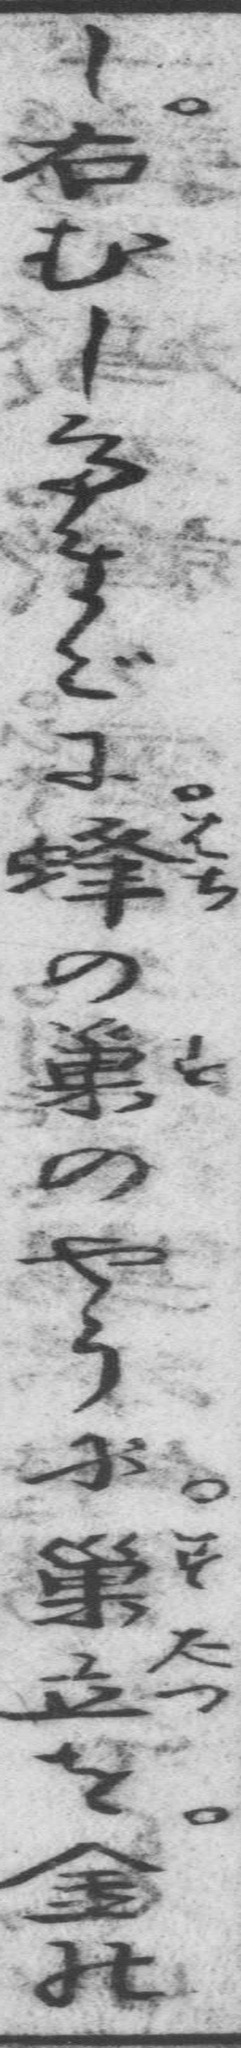し。右むしたまごに。蜂の巣のやうに。巣立を。金の
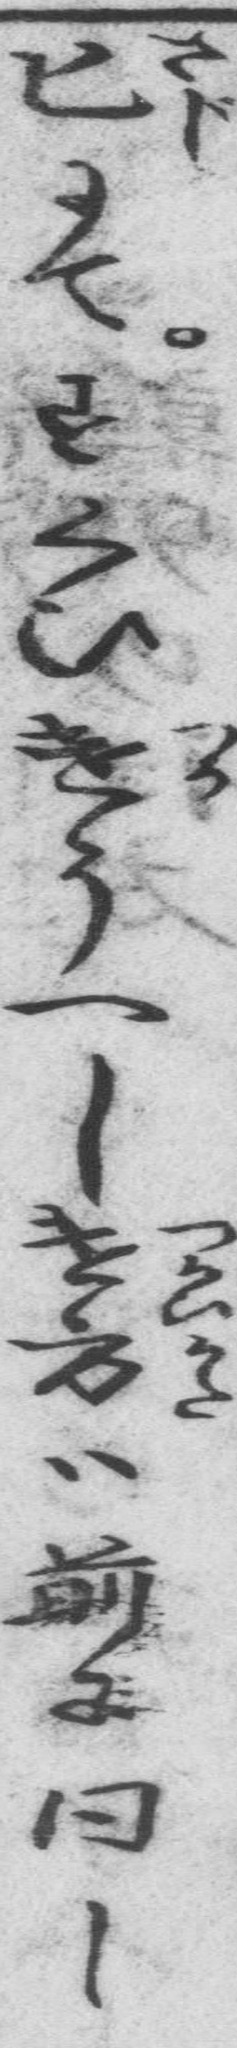匕にて。すくひ遣うへし遣方は前に同し

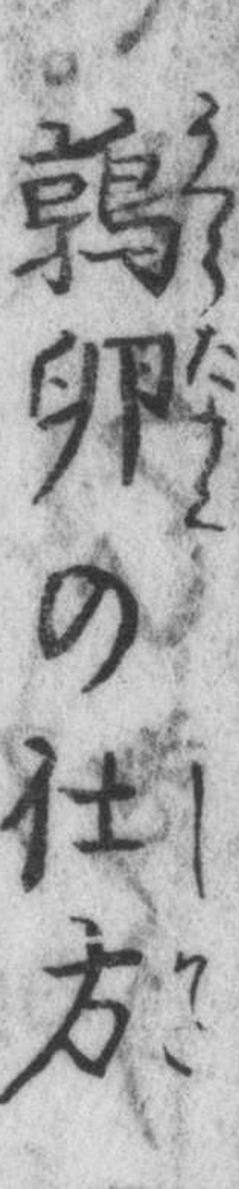鶉卵の仕方
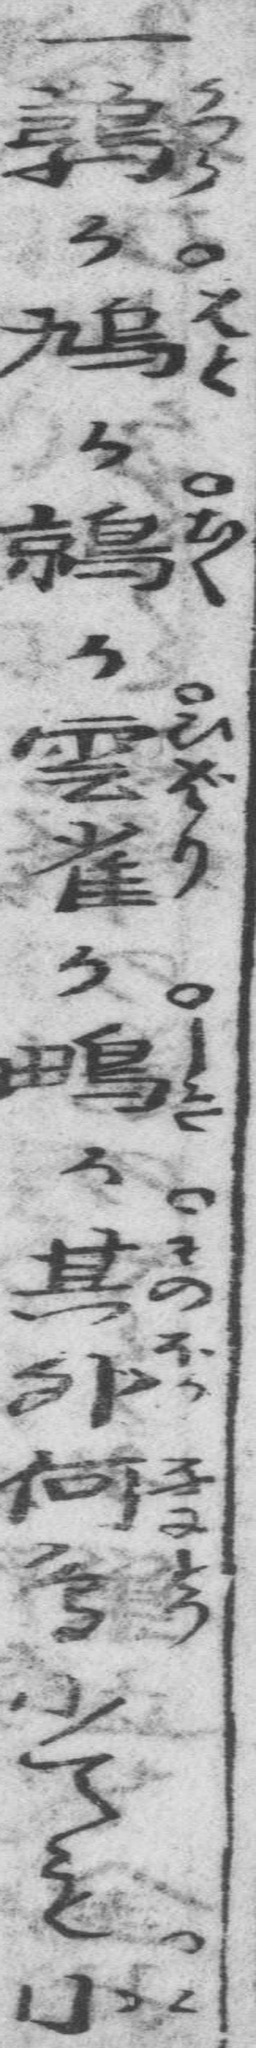一鶉か。鳩か。鶁か。雲雀か。鴫か。其外何鳥にても。小
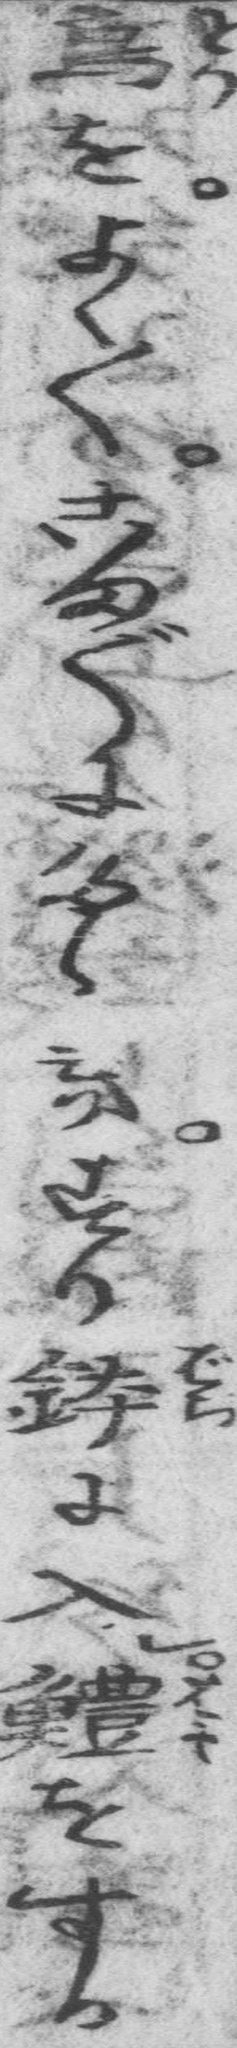鳥を。よく〳〵。こま〴〵にたゝき。すり鉢に入れ。鱧をする
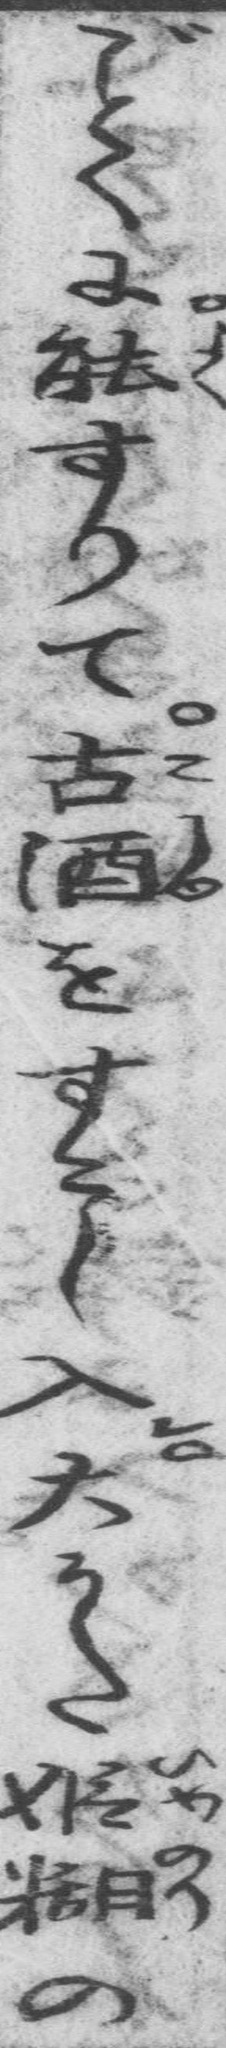ごとくに。能すりて。古酒をすこし入れ。大かた姫糊の
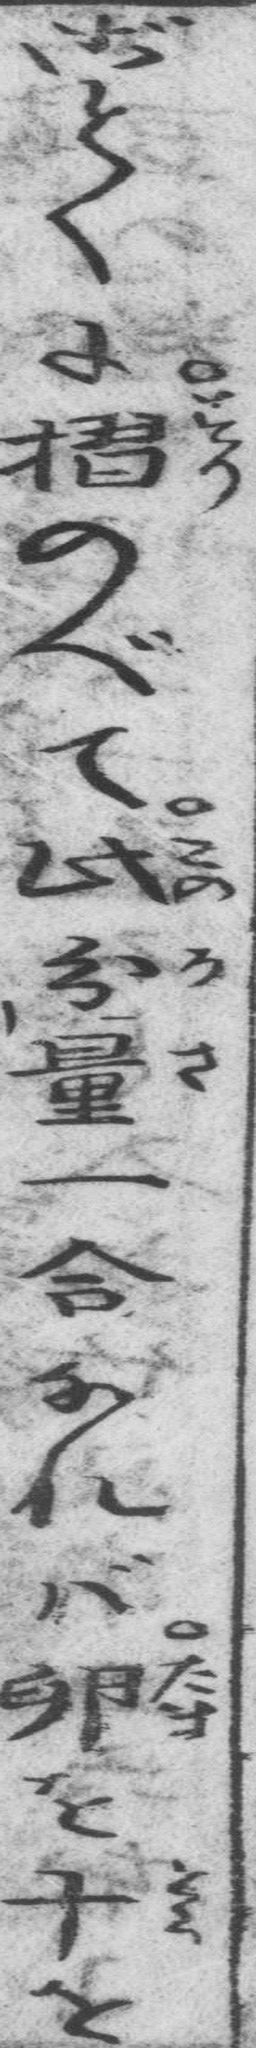ごとくに。摺のべて。此分量一合なれば。卵を十を
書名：萬寳料理秘密箱
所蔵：大阪府立大学学術情報センター 国文学研究資料館
